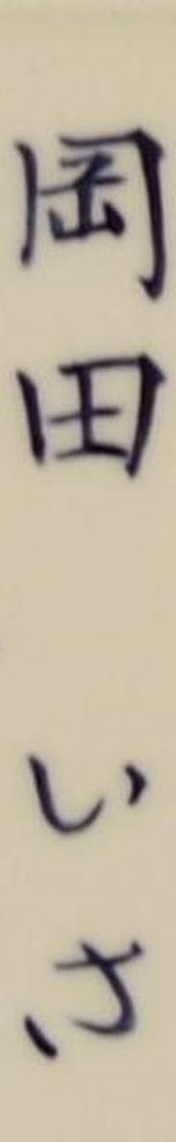岡田いさ
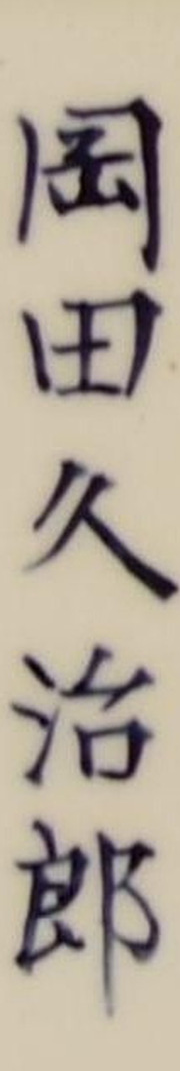岡田久治郎
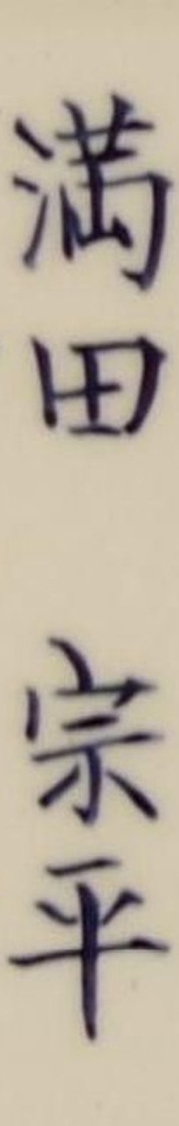満田宗平
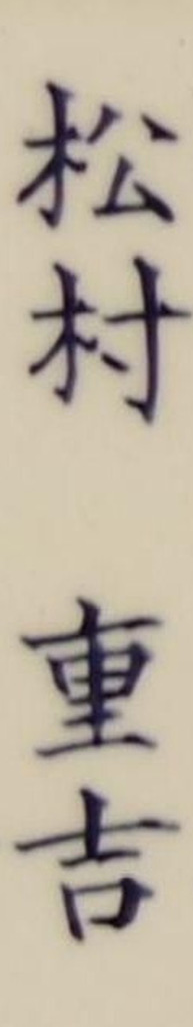松村重吉
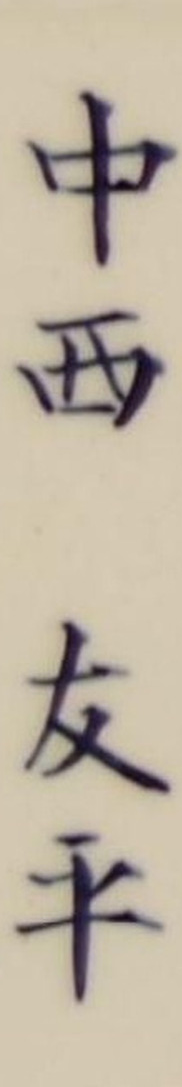中西友平
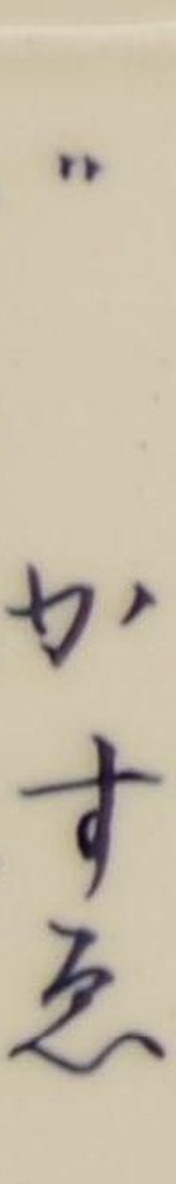かすゑ
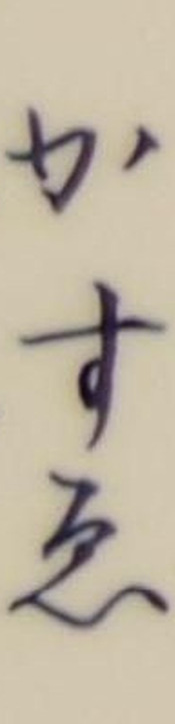かすゑ
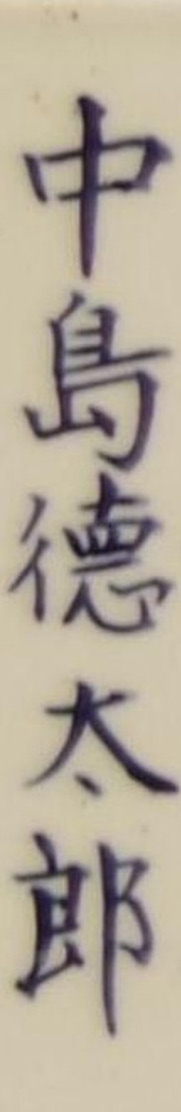中島徳太郎

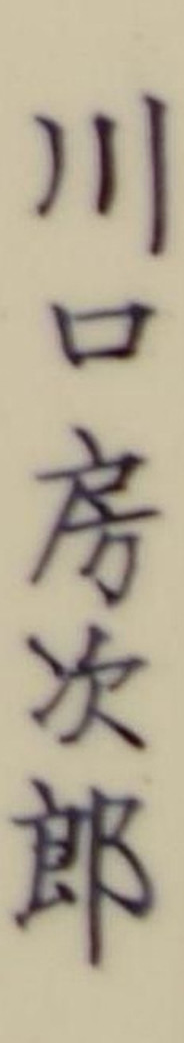川口房次郎
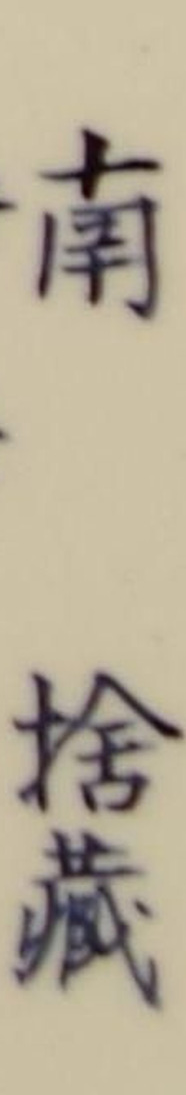南捨蔵
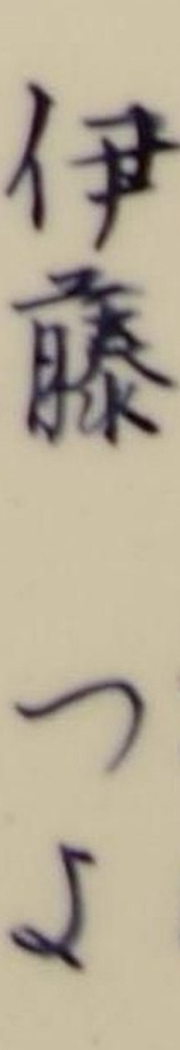伊藤つよ
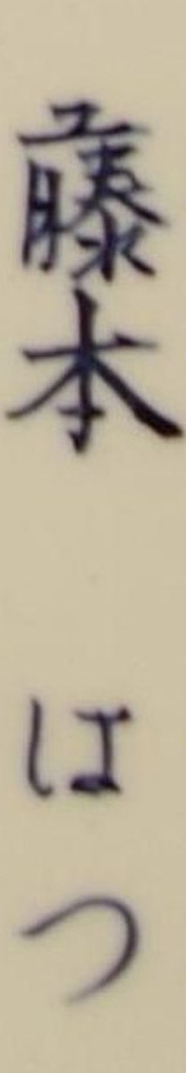藤本はつ
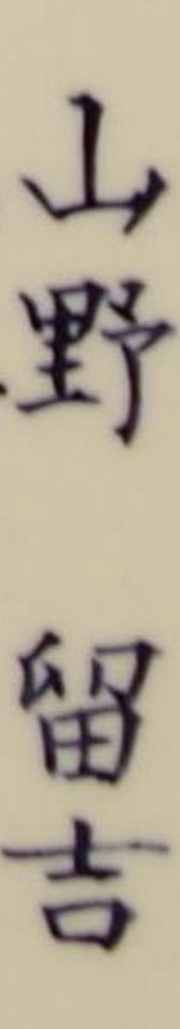山野留吉
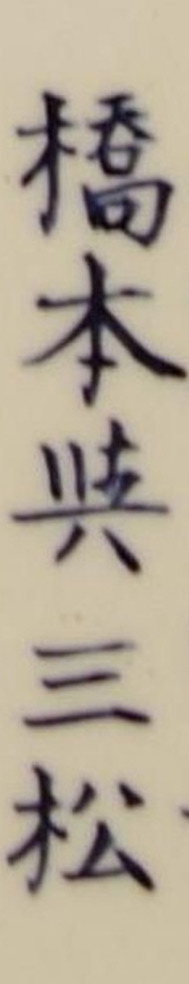橋本与三松
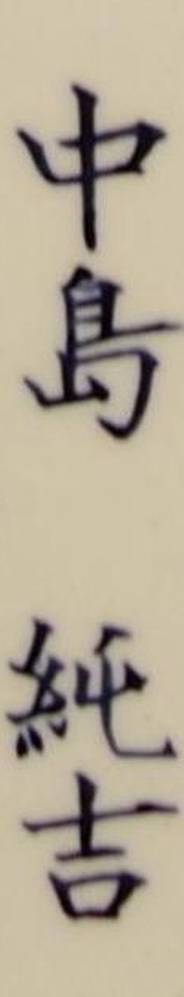中島純吉
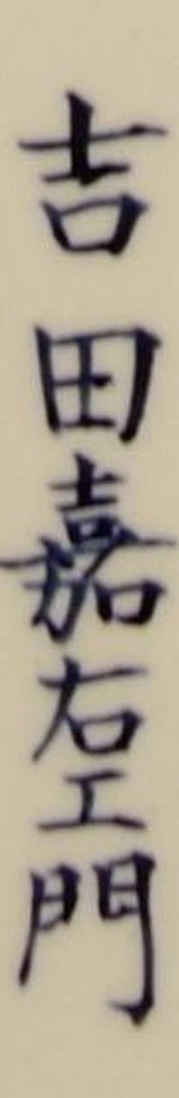吉田嘉右エ門
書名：A~D
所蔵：koyasan kongobuji
